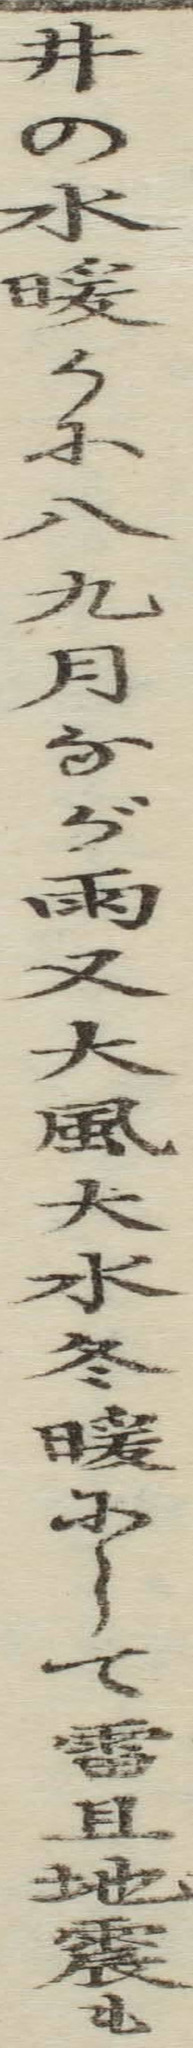井の水暖かに八九月なが雨又大風大水冬暖にして雷且地震も
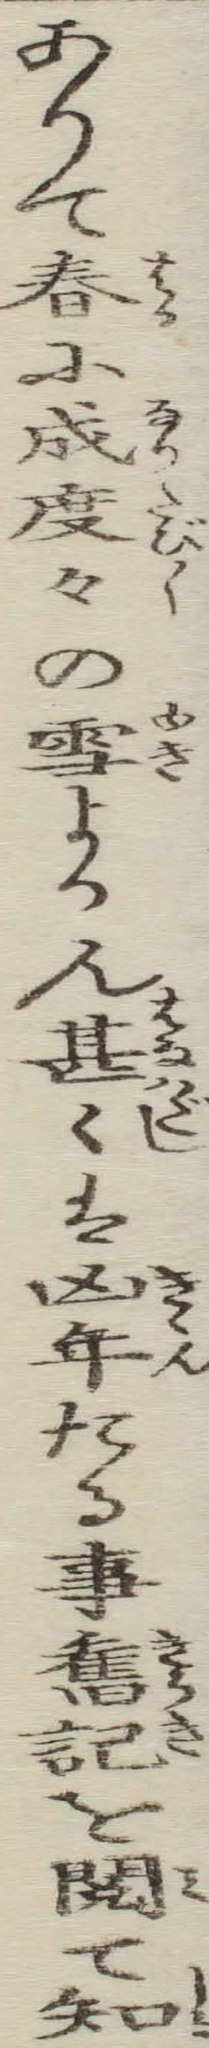ありて春に成度々の雪よかん甚くは凶年たる事舊記を閲て知
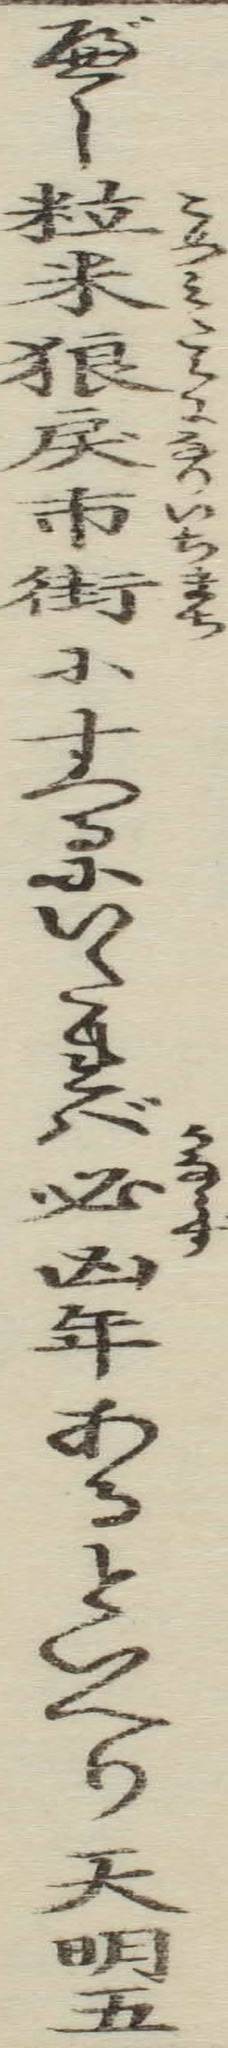べし粒米狼戻市街にすつるにいたれば必凶年あるといへり天明五
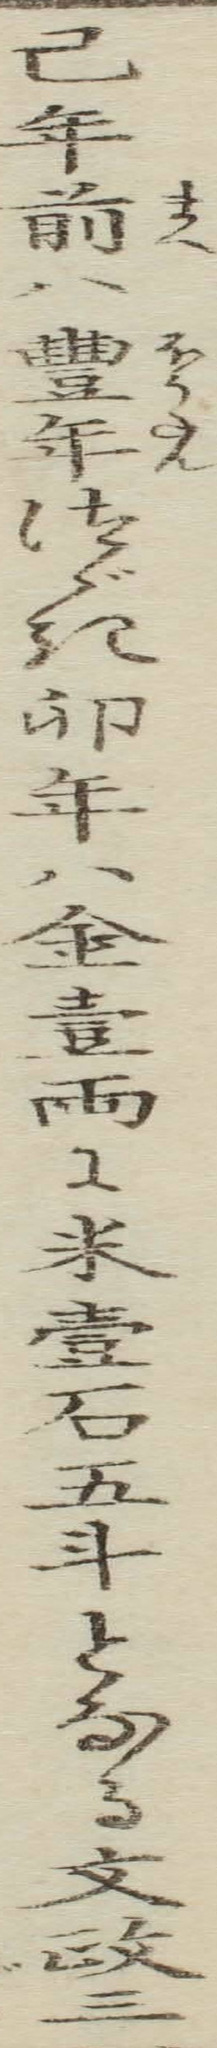己年前は豊年つゞき卯年は金壹両に米壹石五斗となる文政三
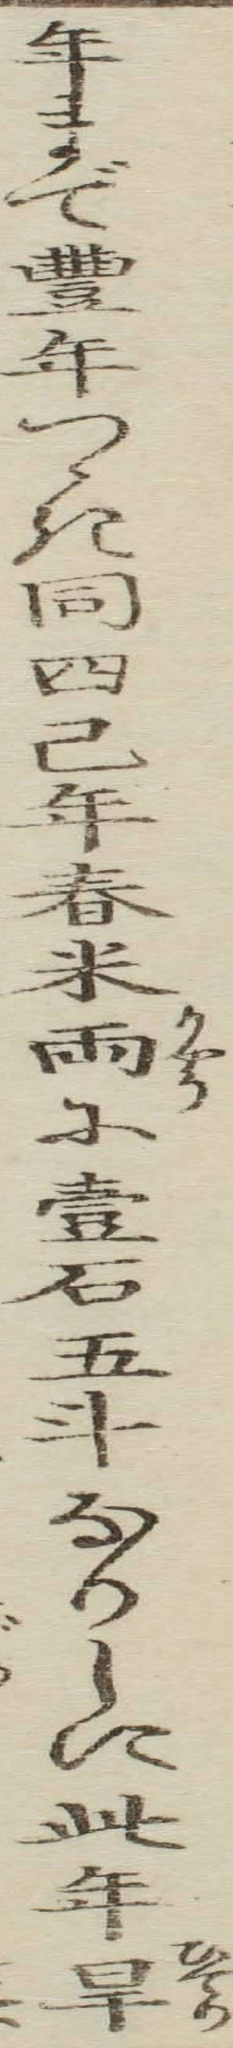年まで豊年つゝき同四己年春米両に壹石五斗なりしに此年旱
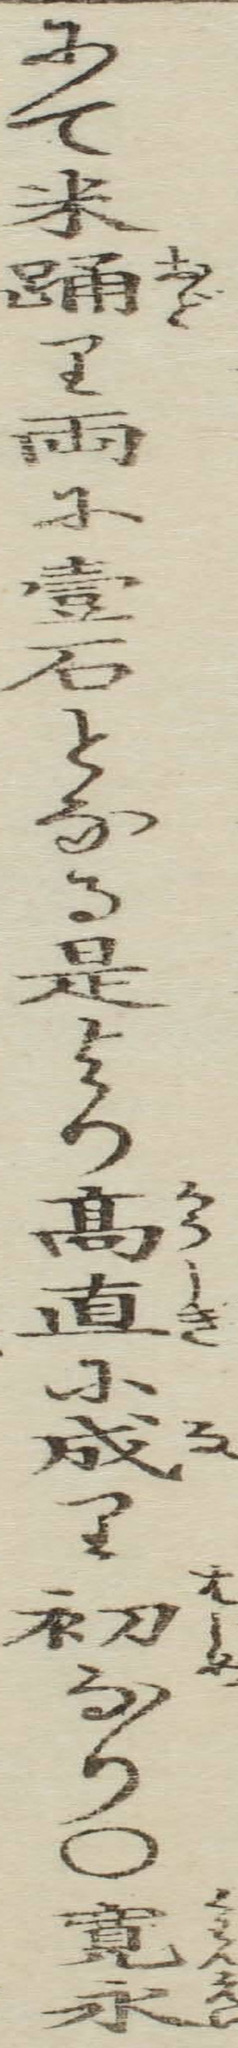にて米踊り両に壹石となる是より高直に成り初なり○寛永
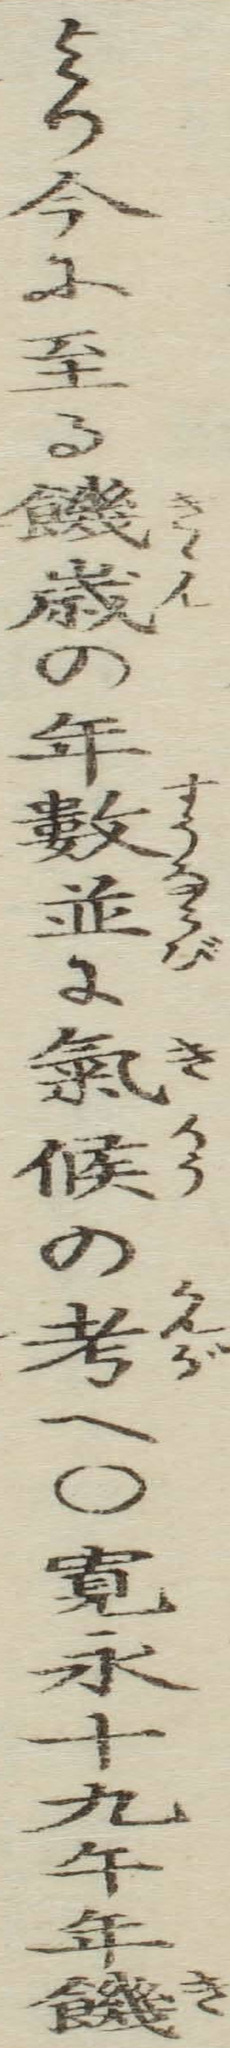より今に至る饑歳の年数並に気候の考へ○寛永十九午年饑
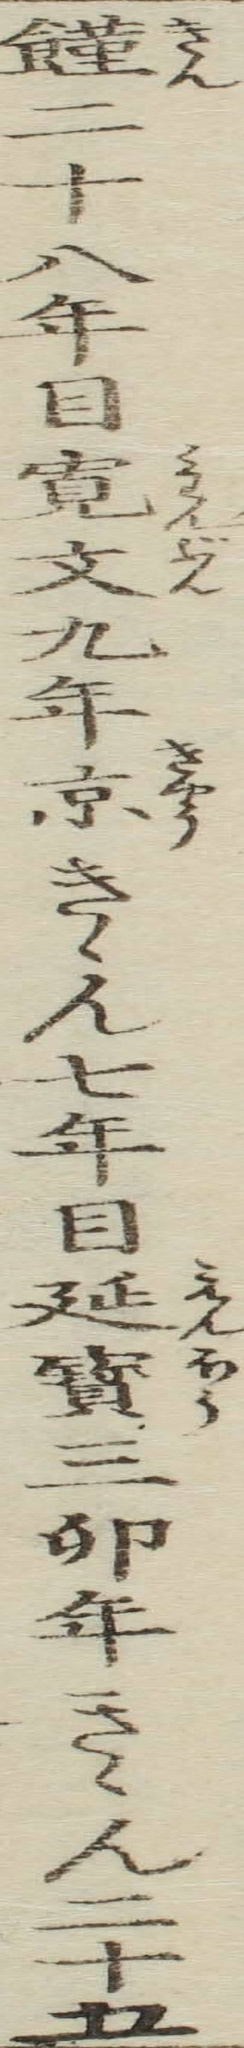饉二十八年目寛文九年京きゝん七年目延宝三卯年きゝん二十五
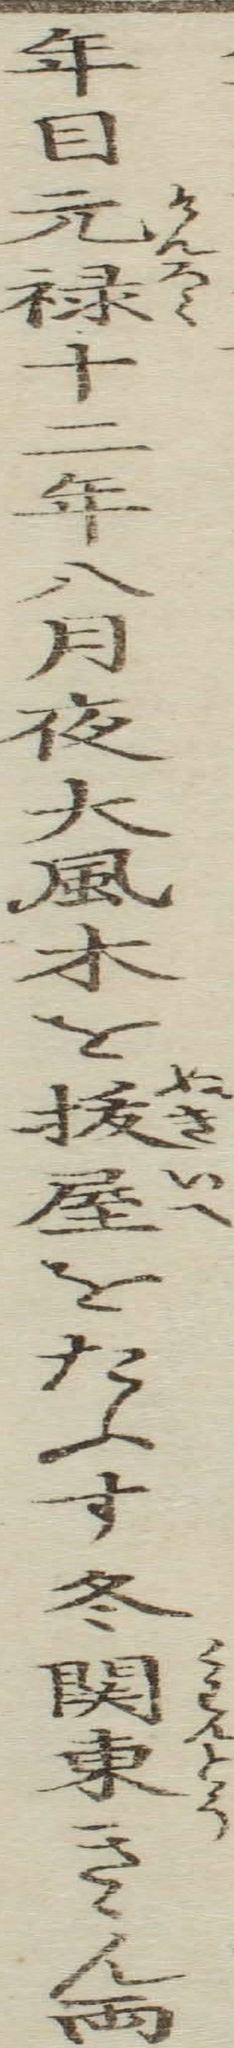年目元禄十二年八月夜大風木を抜屋をたふす冬関東きゝん両

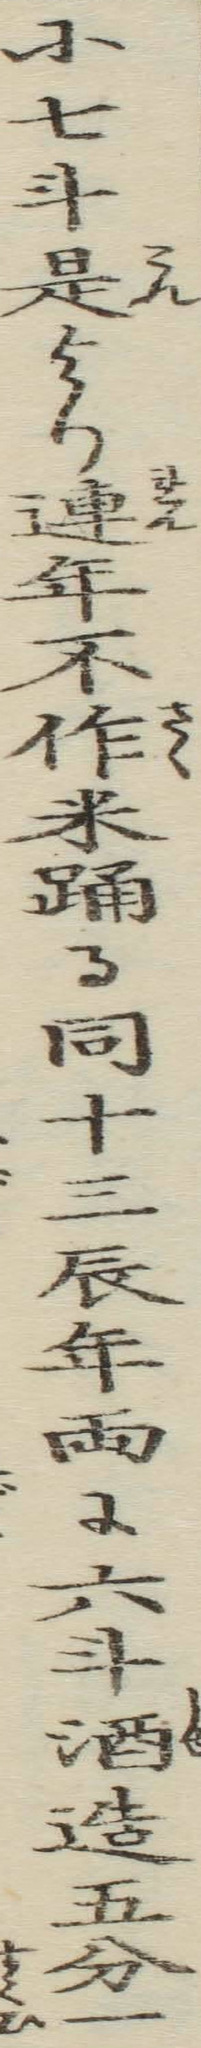に七斗是より連年不作米踊る同十三辰年両に六斗酒造五分一
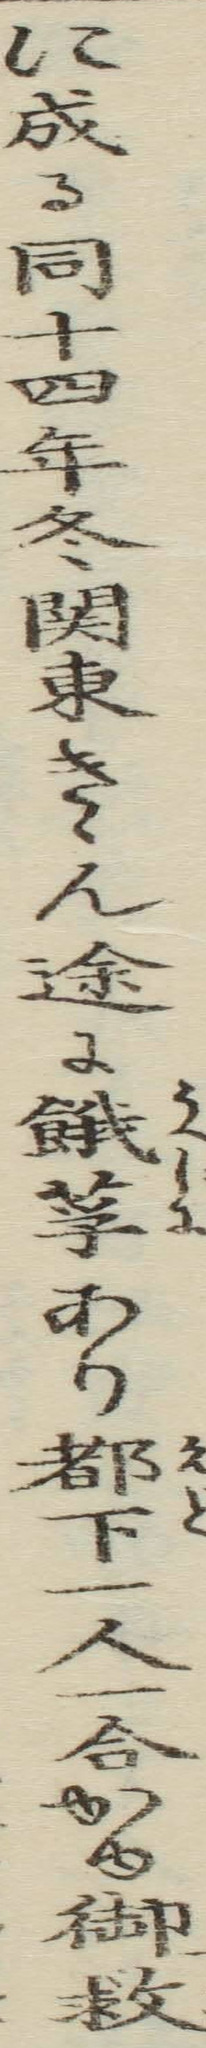に成る同十四年冬関東きゝん途に餓莩あり都下一人一合かゆ御救
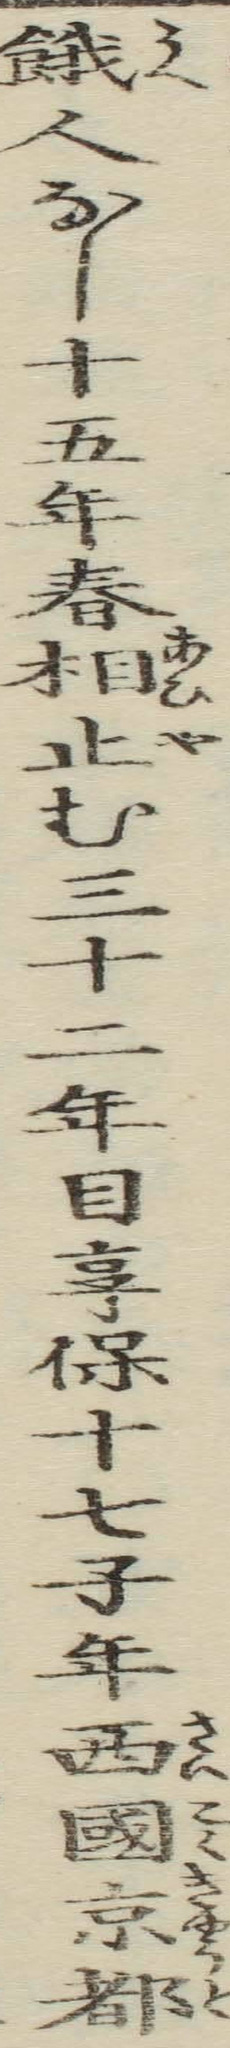餓人なし十五年春相止む三十二年目享保十七子年西国京都
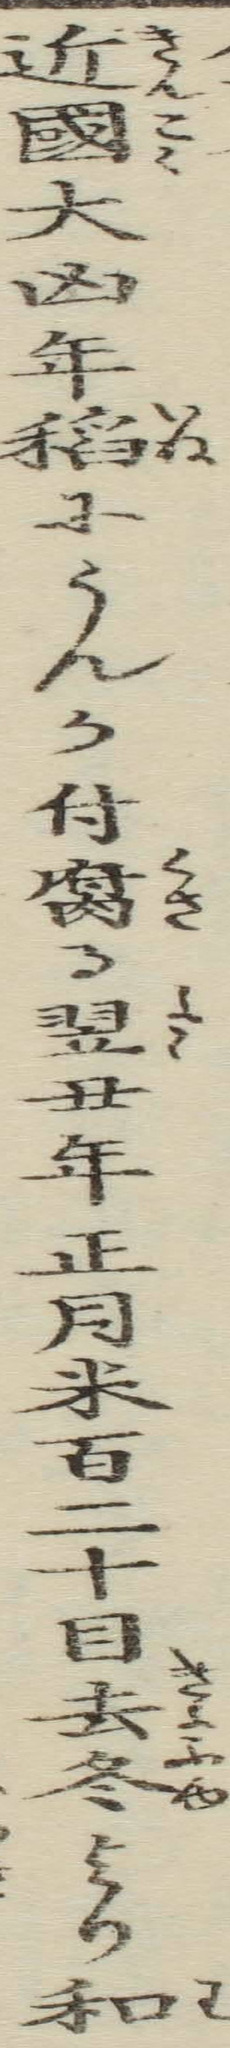近国大凶年稲にうんか付腐る翌丑年正月米百二十目去冬より和
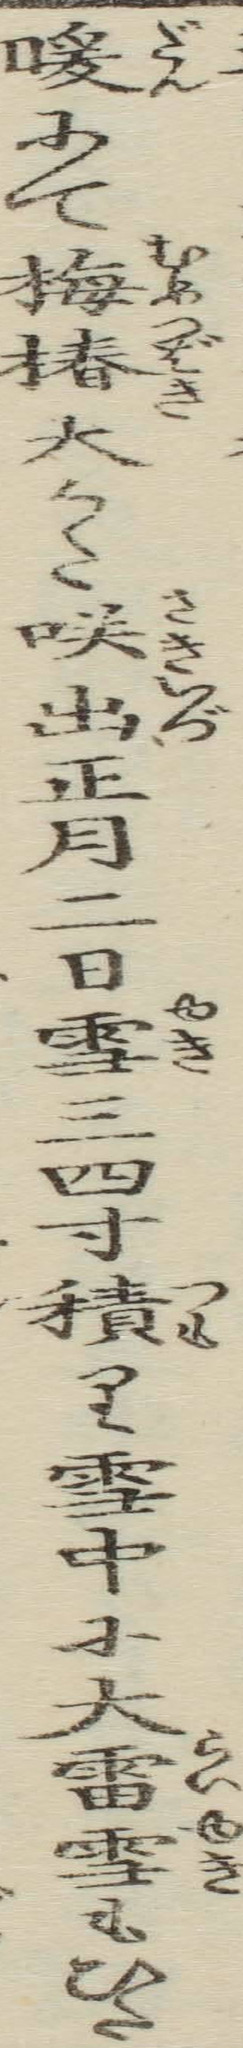暖にて梅椿大かた咲出正月二日雪三四寸積り雪中に大雷雪もひた
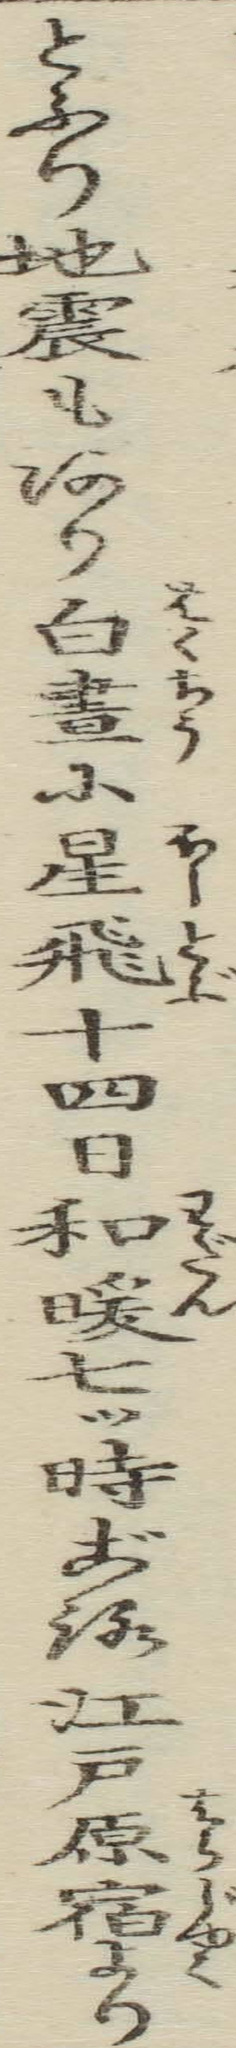とふり地震もあり白昼に星飛十四日和暖七ッ時ごろ江戸原宿より
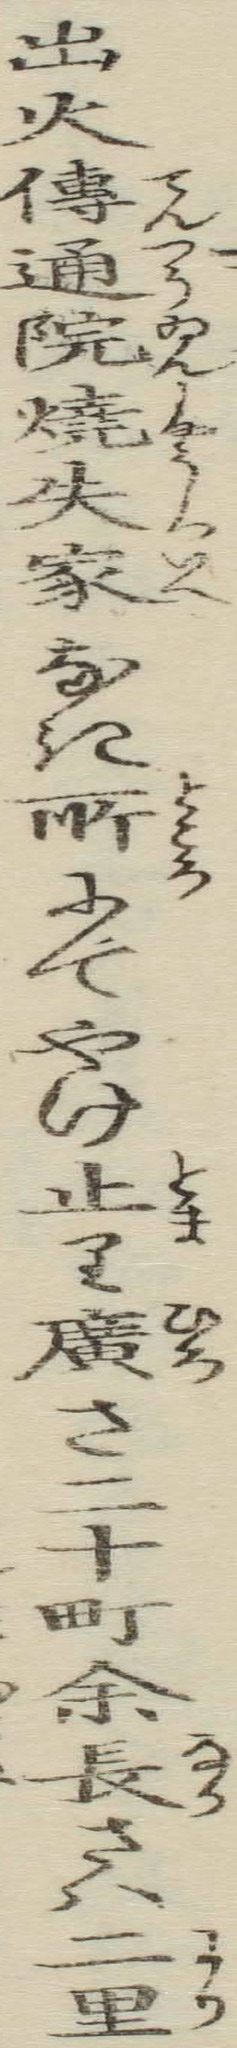出火伝通院焼失家なき所にてやけ止り広さ二十町余長さは二里
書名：救荒便覧
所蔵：国文学研究資料館
